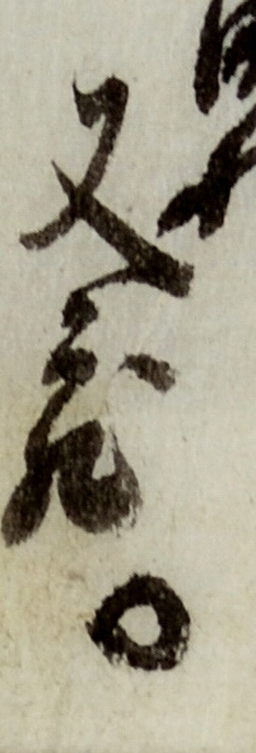又蔵○

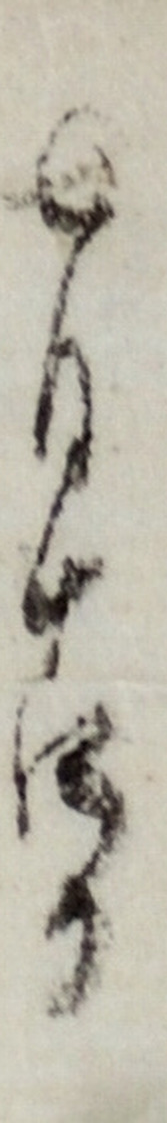七月十四日
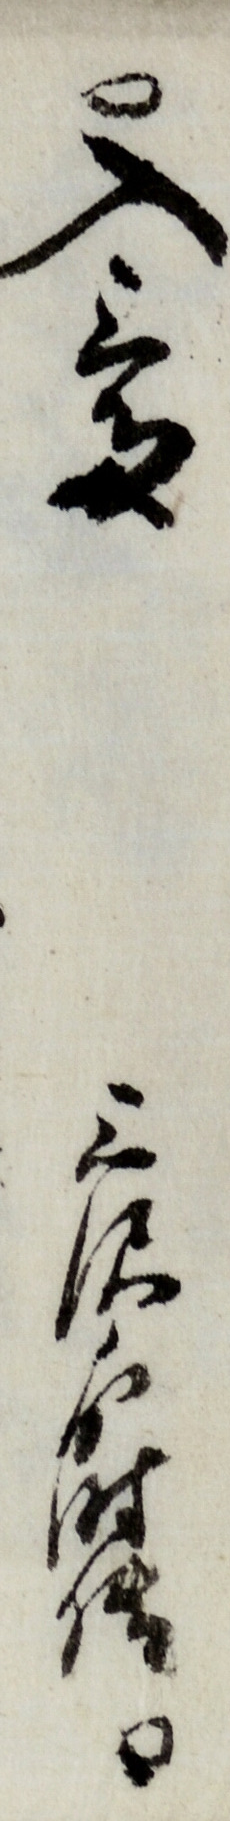〇入三両三沢ゟ時借〇、
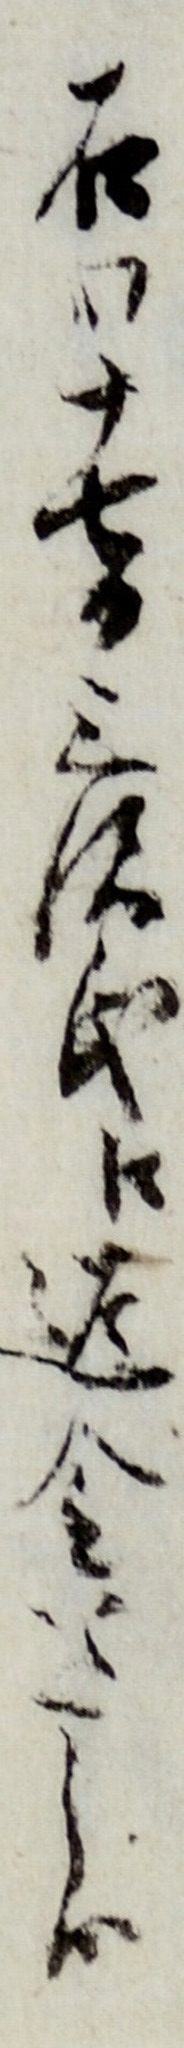右同十七日三沢氏江返金いたし分
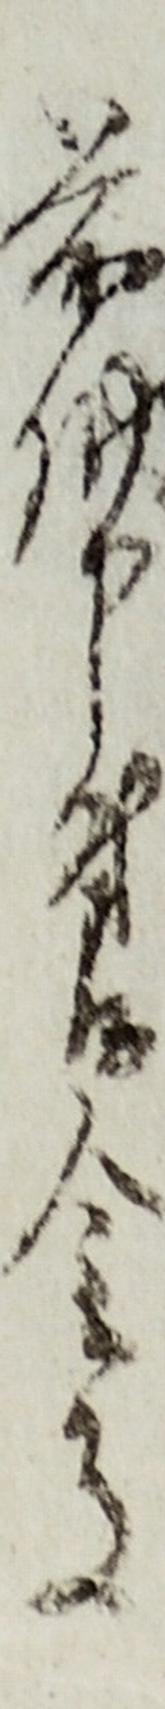倒申付候金子
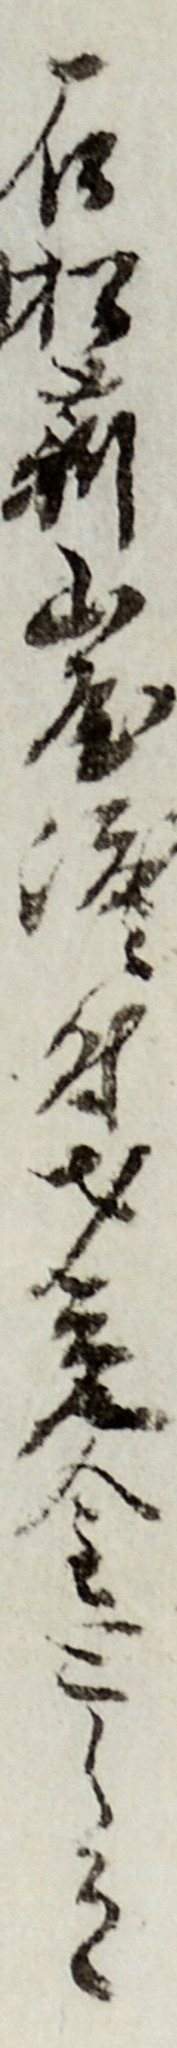右松薪山屋渡ニ付才覚金として前
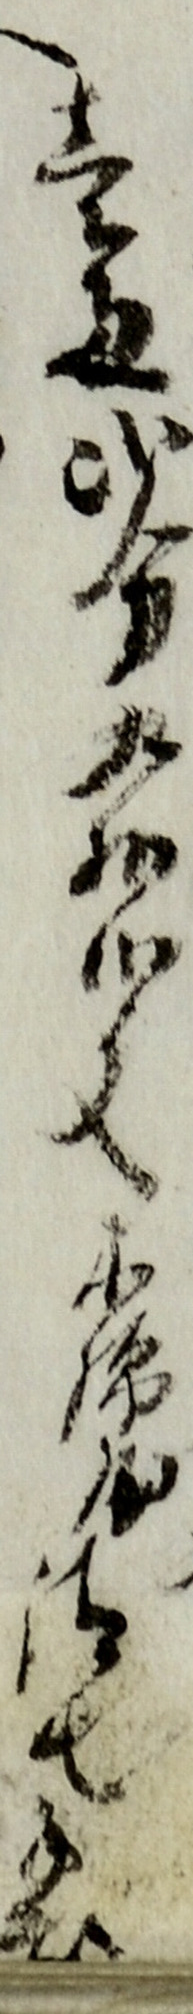壱両弐分五拾弐文木挽代清七手形
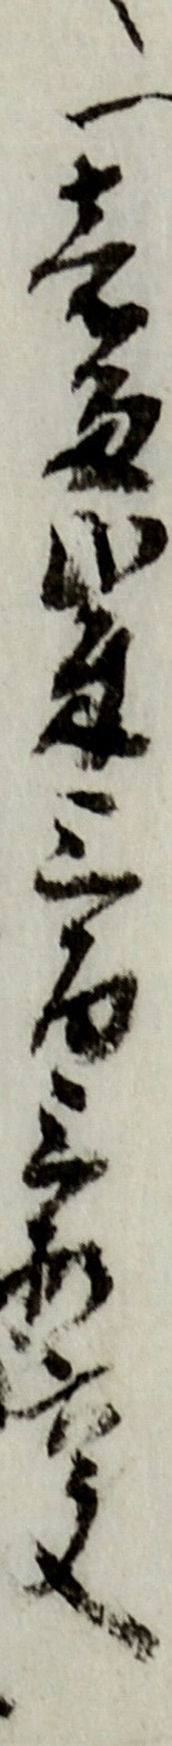壱両弐朱三百三拾六文
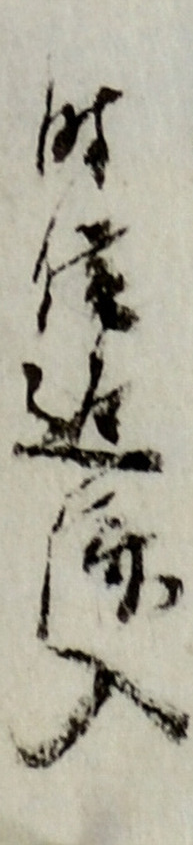時借返済入

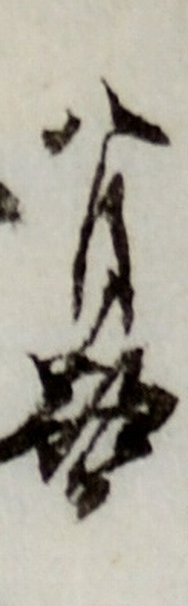八月朔日
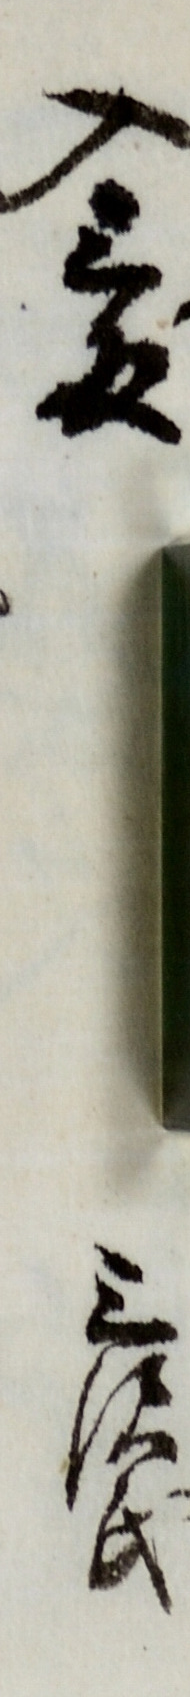入三両三沢氏
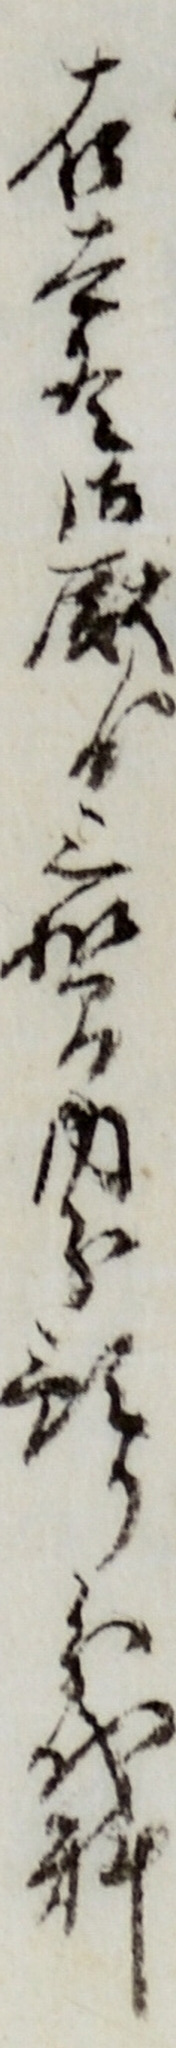右去冬御厭ゟ三拾間内分預り分伐料
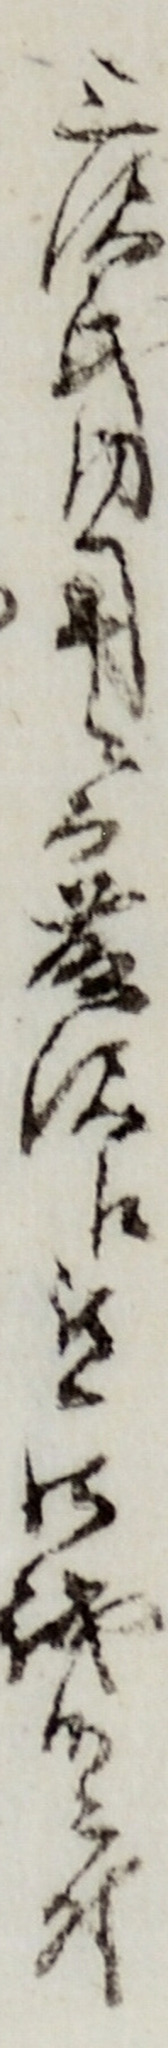三沢氏内用二而藤沢江被罷越候二付
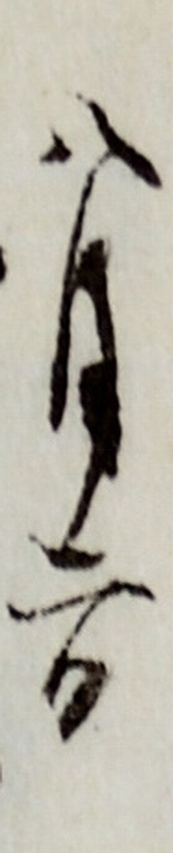八月二日
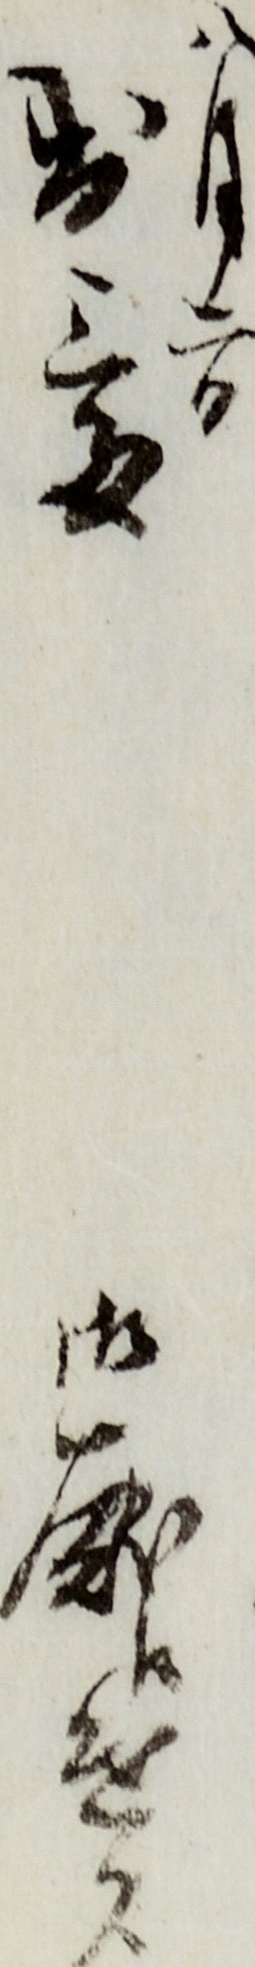出三両御厩江遣ス
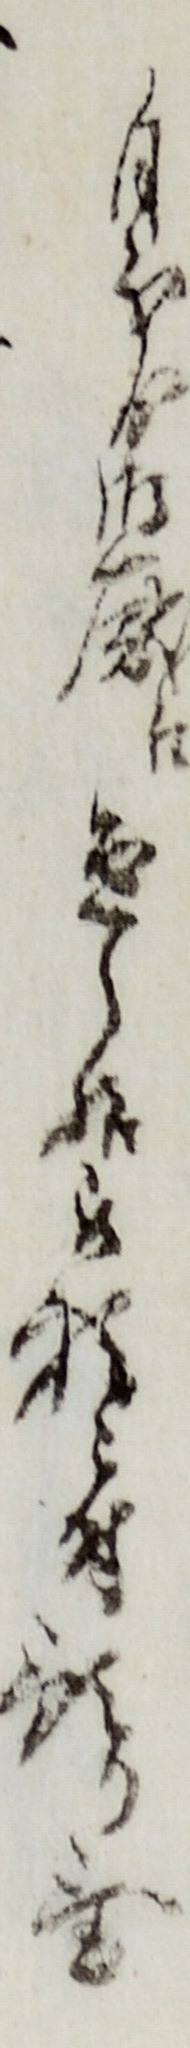自分ゟ御厭江遣候用被頼ニ預り置
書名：中沢郷御竹薮見廻り
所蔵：伊那市立高遠町図書館・合同会社AMANE
